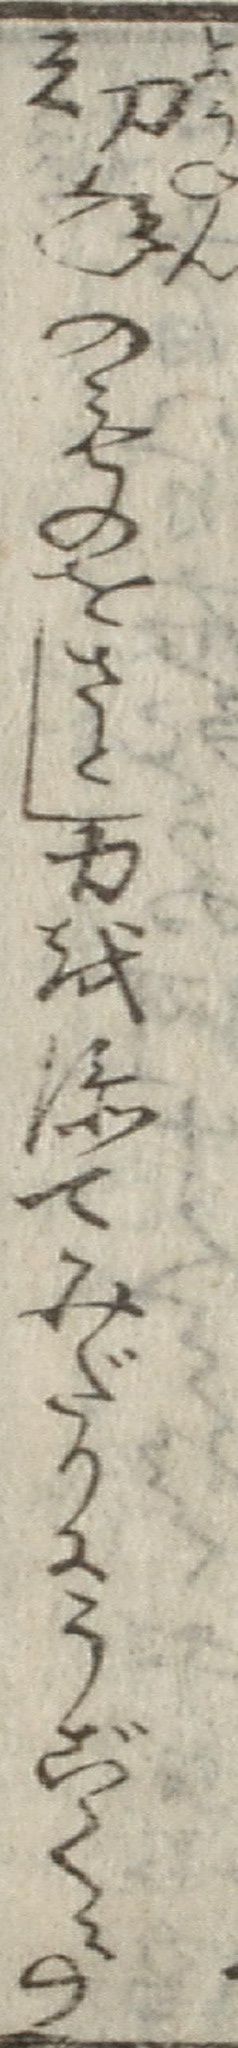幼年のものをさとし力を添てみだりにうごく事
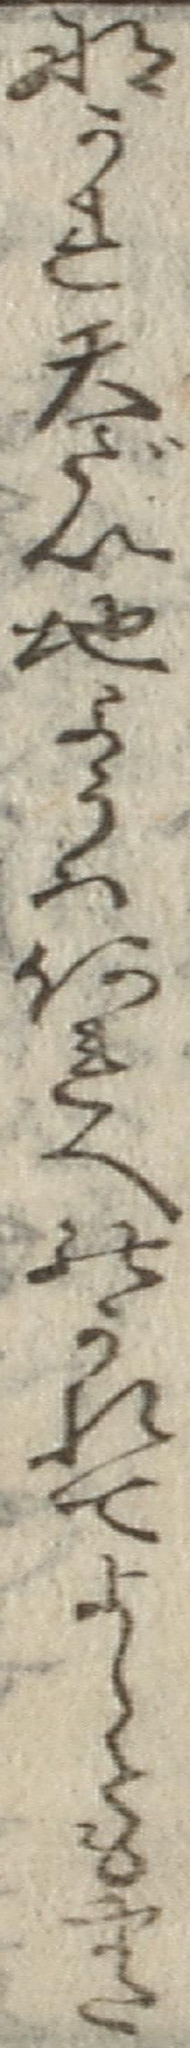なかれ天ざい地ようハ何れへのかれてよしともまた
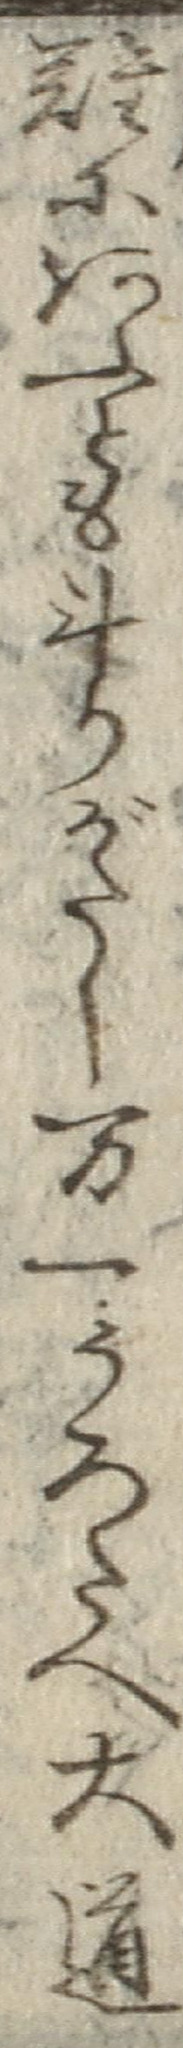難にあふとも斗りがたし万一うろたへ大道
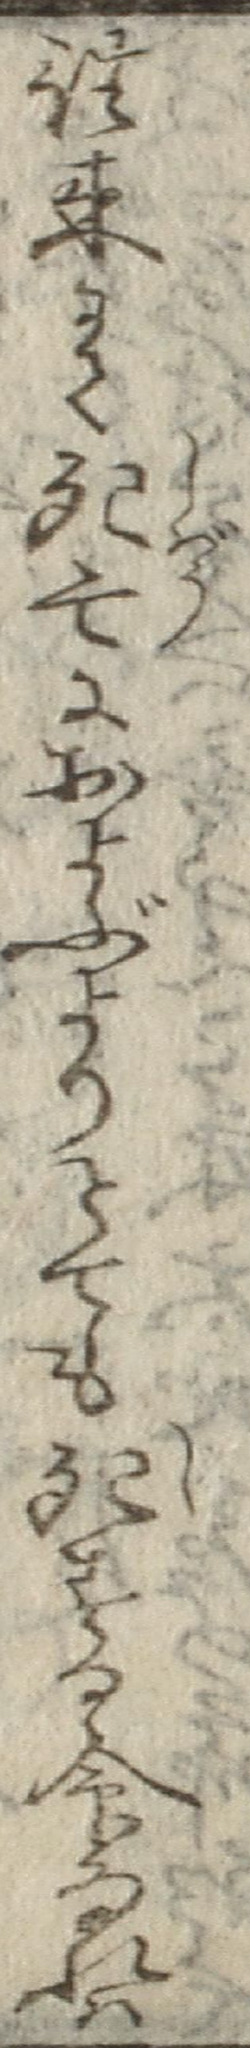往来にて死亡におよぶよりとても死する命なれハ
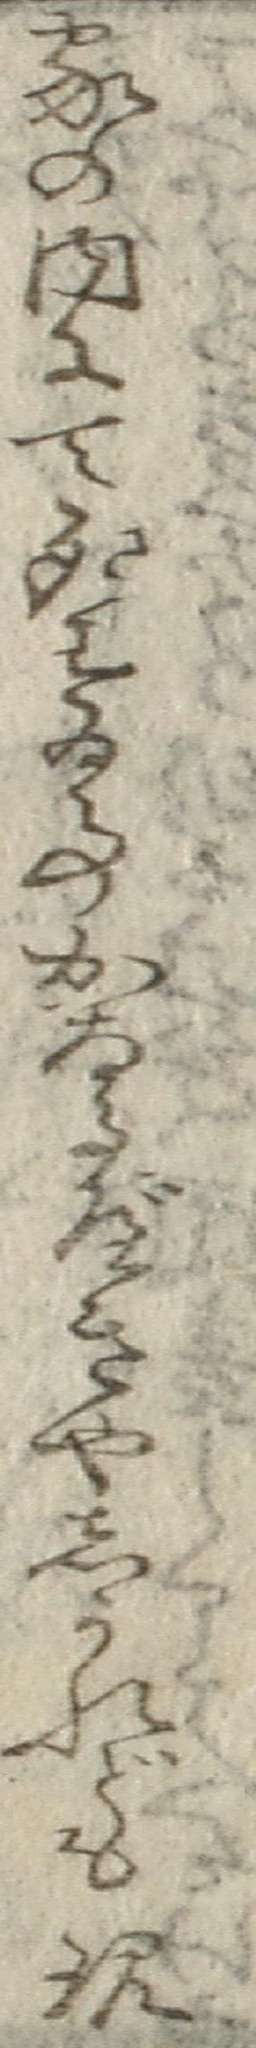家の内にて死する事かなるべきやしかれども現
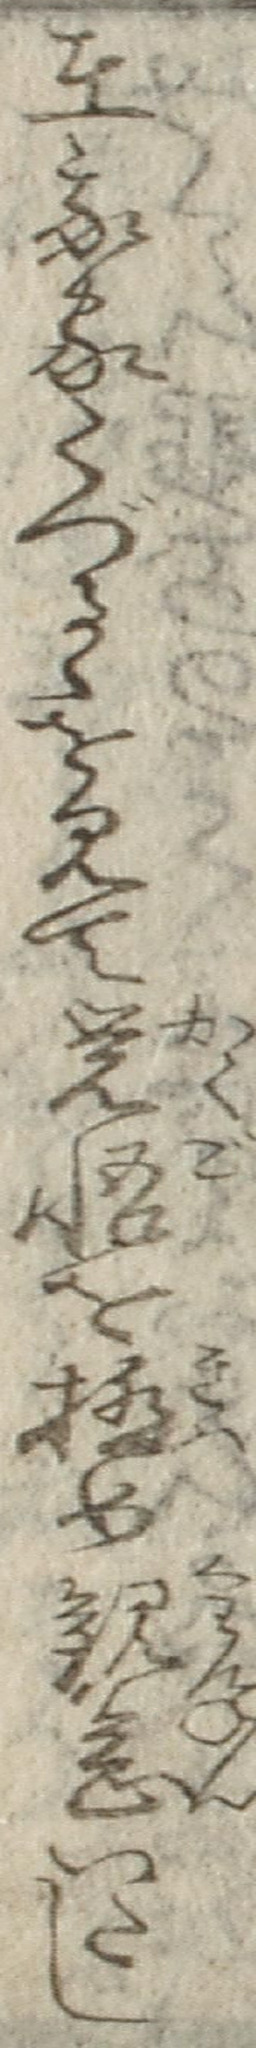在我家くづるゝを見て覚悟を極め観念いたし
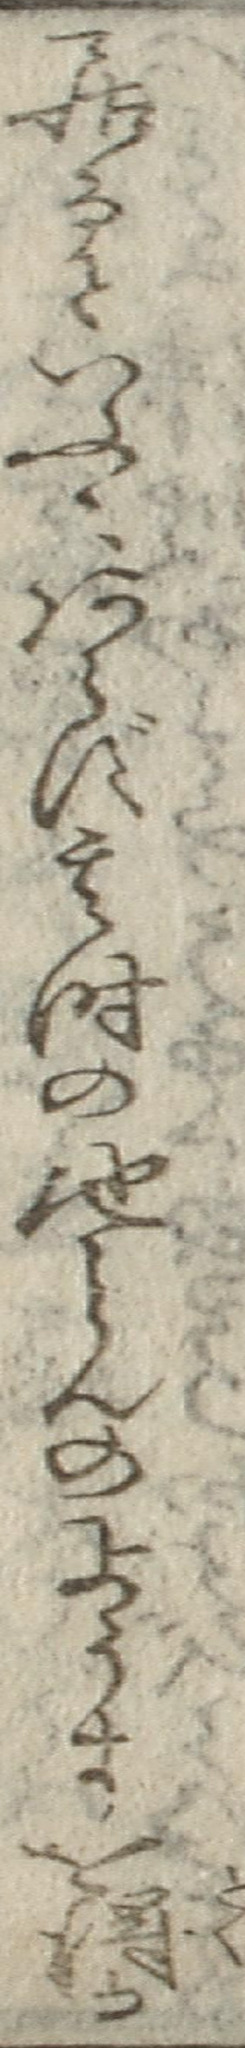居るをいふニあらず其時の地しんのようすを得る
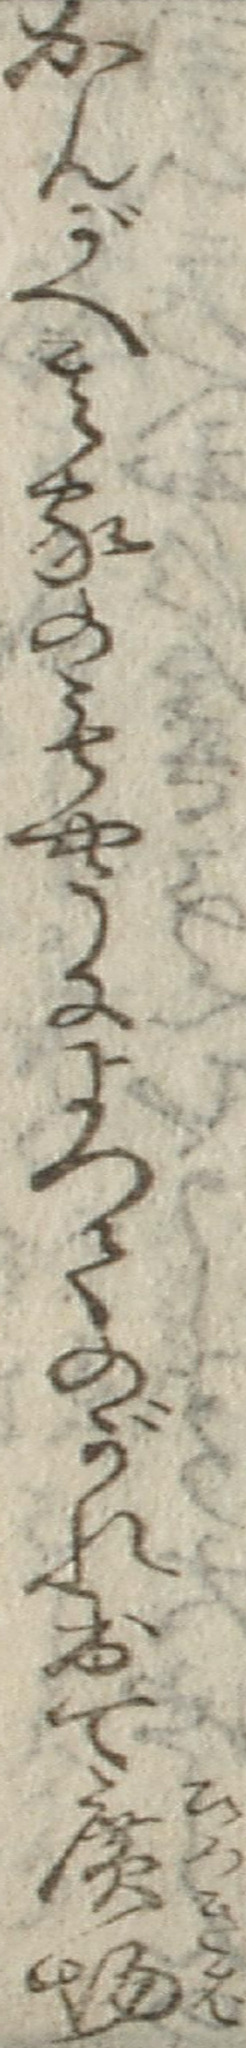かんがへ其家のもやうによつてのがれ出て広場
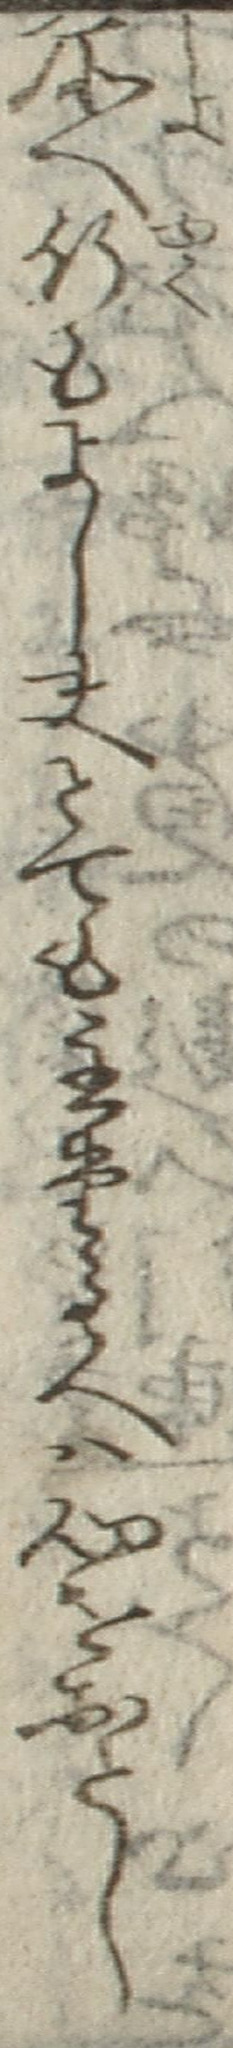所へ行もよし夫とても主たる人ハ心をおとし

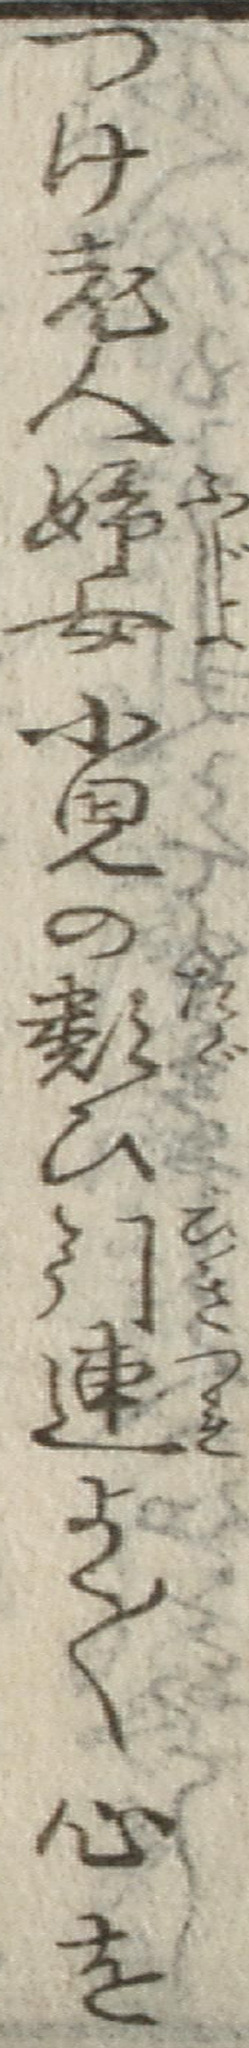つけ老人婦女小児之類ひ引連よく〳〵心を
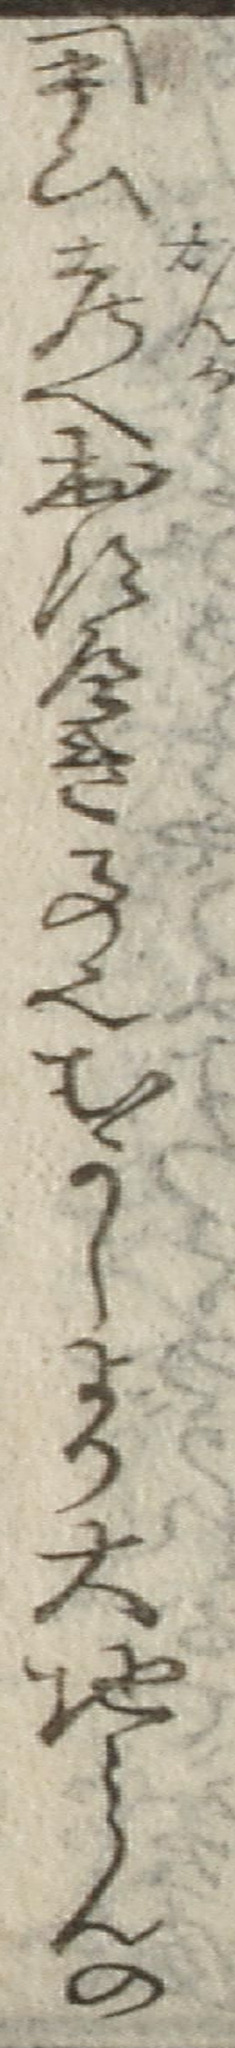用ひ考へ出すへき事也むかしより大地しんの
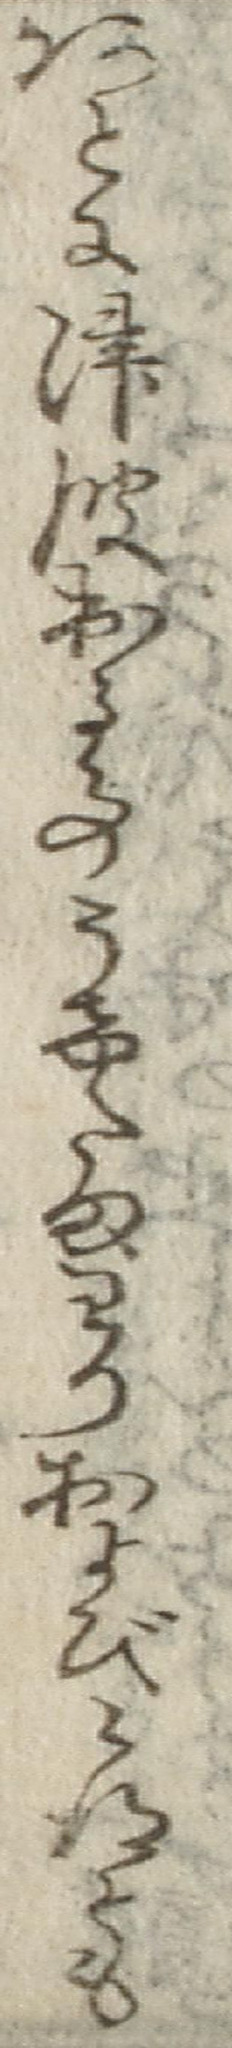あとに津波出る事うけたまわりおよび候得とも
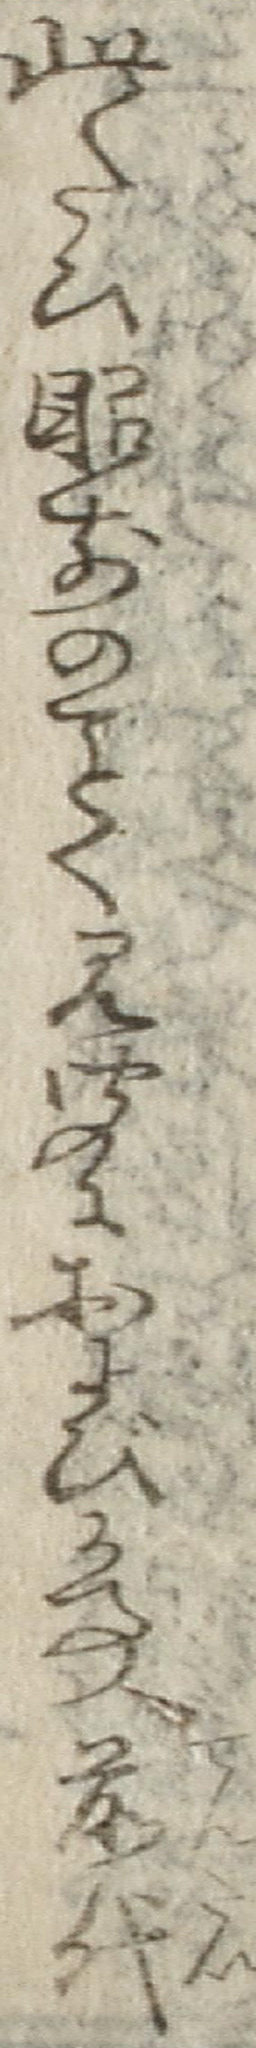此たひ眼前のことく見聞におよび候事前代
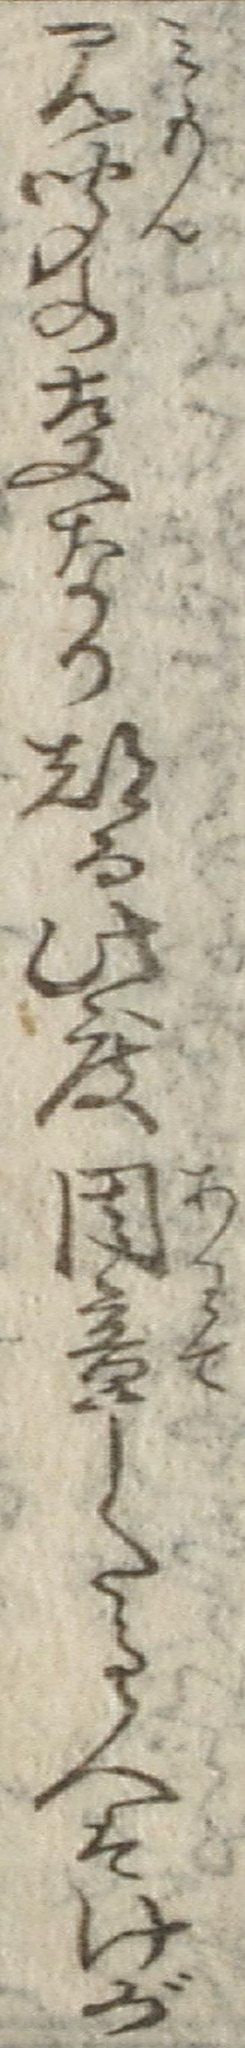見聞の事なり斯而此度周章したる人はけが
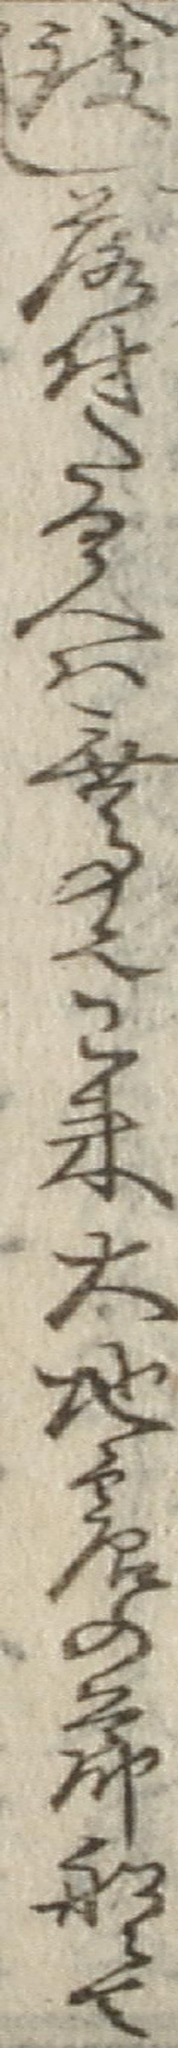致し落付たる人ハ無事也已来大地震の節船にて
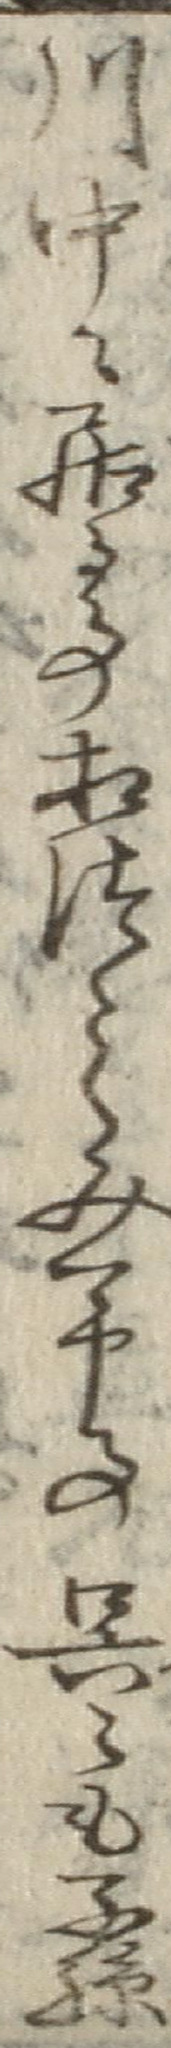川中ニ居る事相つつしみ可申事呉〻も子孫
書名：世直り艸紙
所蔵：東京大学地震研究所図書室 Earthquake Research Institute Library, The University of Tokyo, JAPAN
